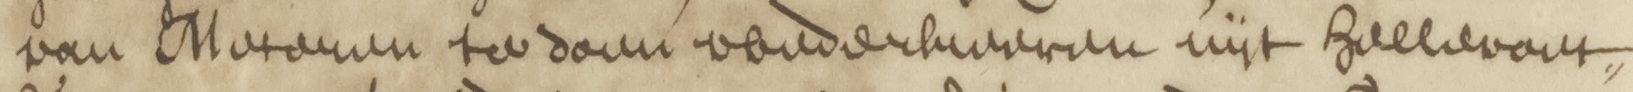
van Meteren te doen wederkeeren uijt Hellevoet„
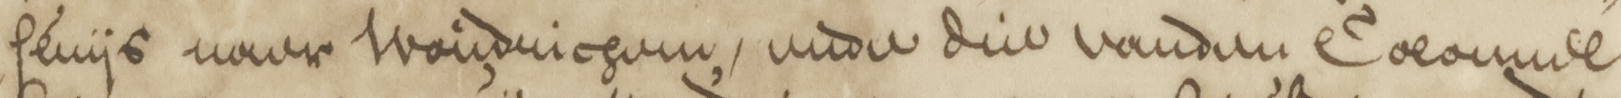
„sluijs naer Woudrichem, ende die vanden Colonnel
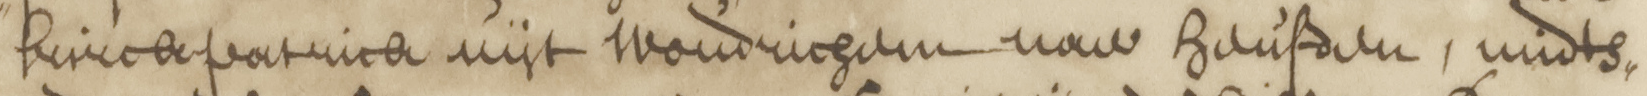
Kirckpatrick uijt Woudrichem nae heusden, midts„
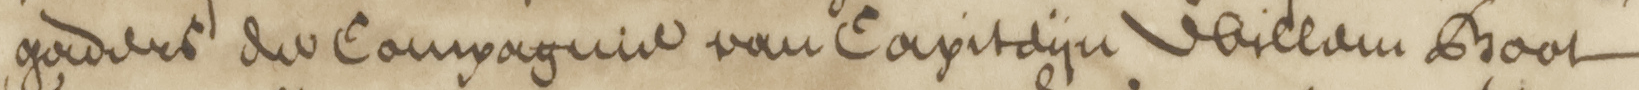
„gaders de Compagnie van Capiteijn Willem Boot
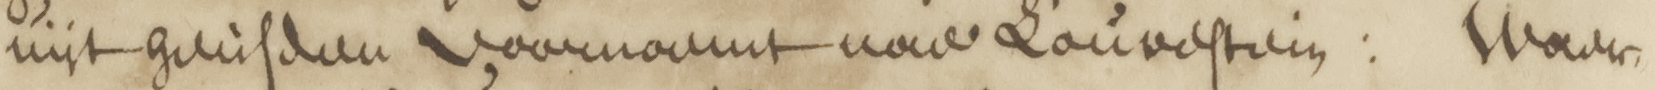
uijt heusden voornoemt nae Louvestein: Waer„
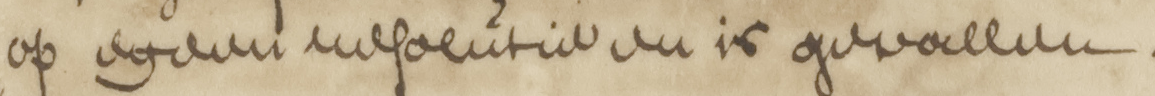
„op egeen resolutie en is gevallen.
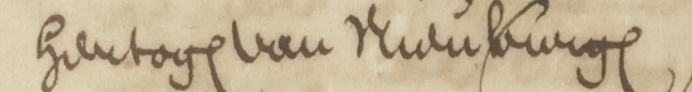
hertogh van Nieuburgh
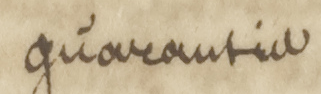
guarantie
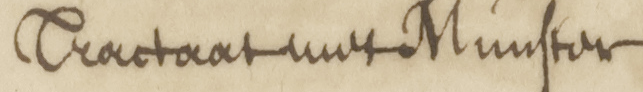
Tractaat met Munster
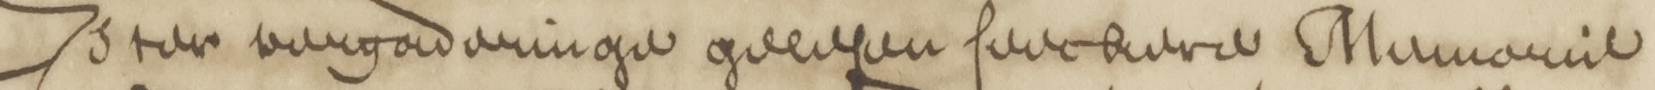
Is ter vergaderinge gelesen seeckere Memorie
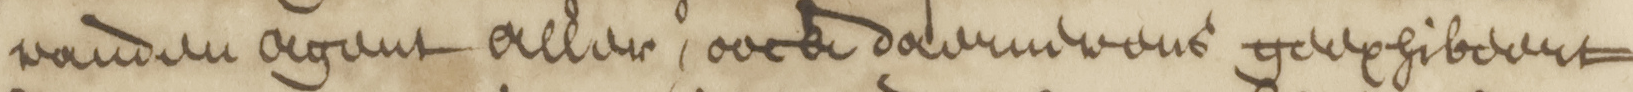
vanden agent Aller, oock daernevens geexhibeert
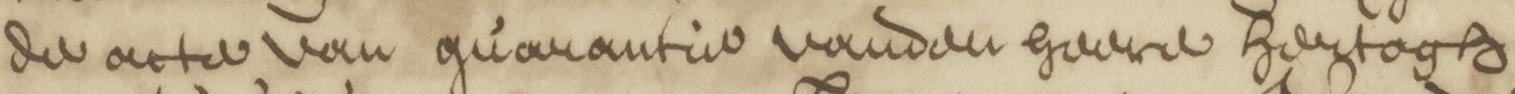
de acte van guarantie vanden heere hertogh
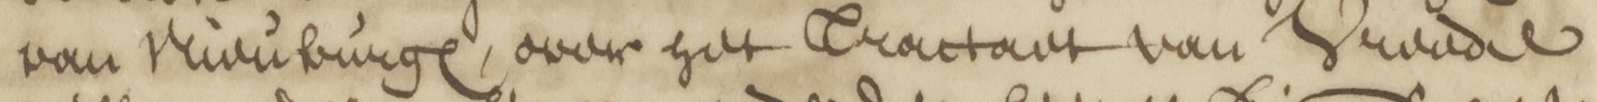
van Nieuburgh, over het Tractaet van Vreede
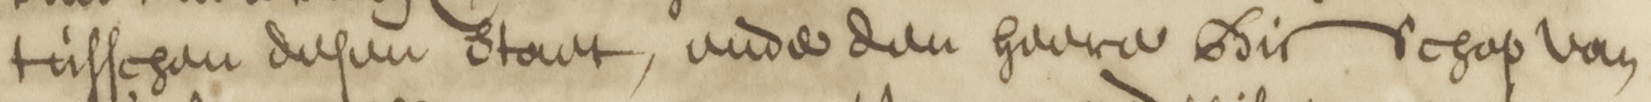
tusschen desen Staet, ende den heere Bisschop van
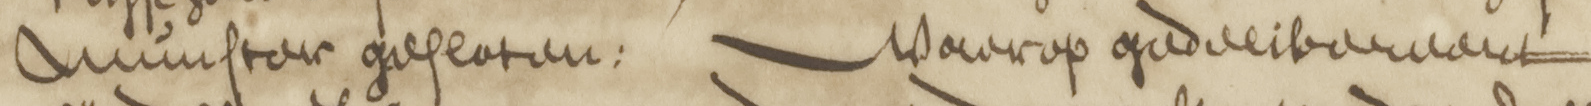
Munster gesloten: Waerop gedelibereert
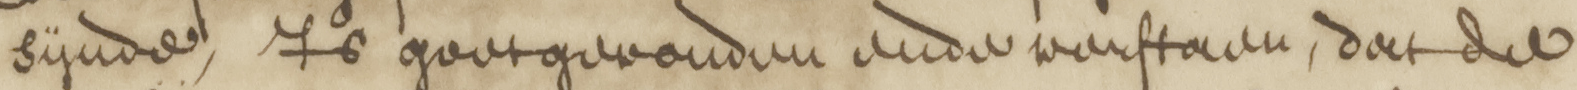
sijnde, Is goetgevonden ende verstaen, dat de
